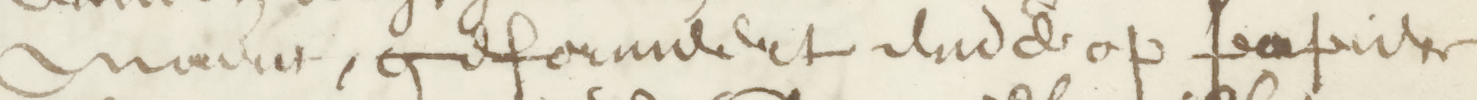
maent, geformeert ende op papier
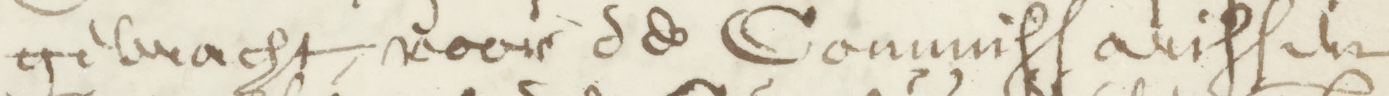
gebracht, voor de Commissarissen
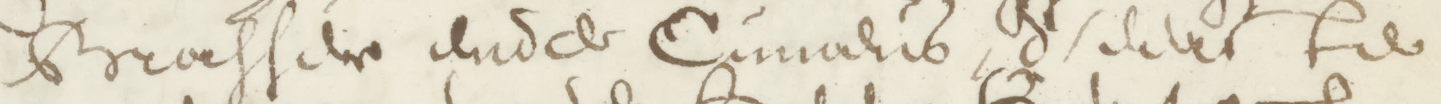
Brasser ende Cumeus, d‛eerste
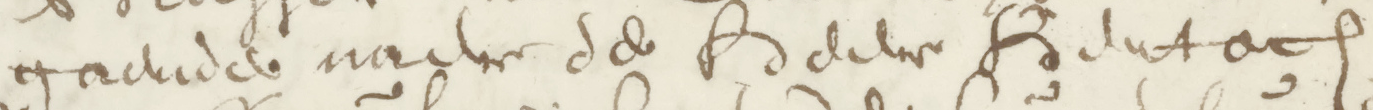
gaende naer de Heer Hertoch
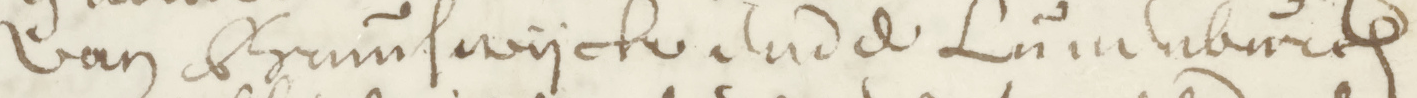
van Brunswijck ende Lunenburch
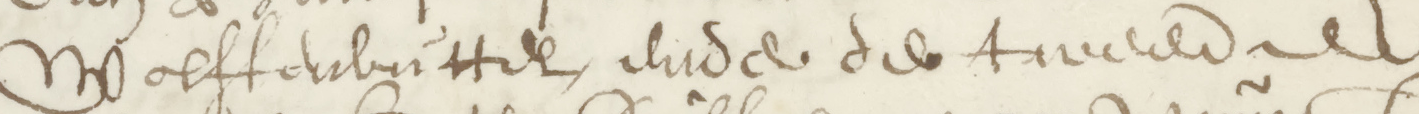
Wolffenbuttel, ende de tweede
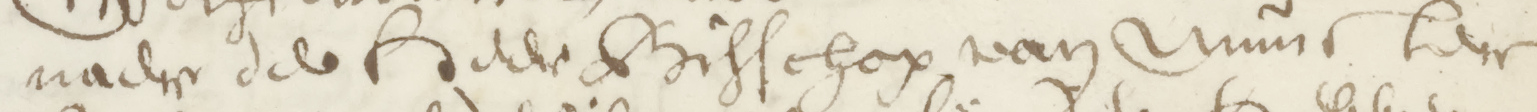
naer de Heer Bisschop van Munster;
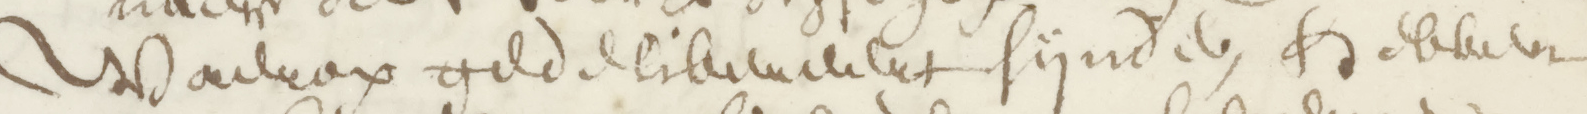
Waerop gedelibereert sijnde, hebben
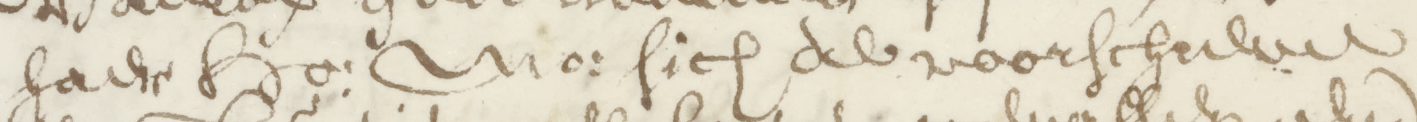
haer Ho:Mo: sich de voorschreve
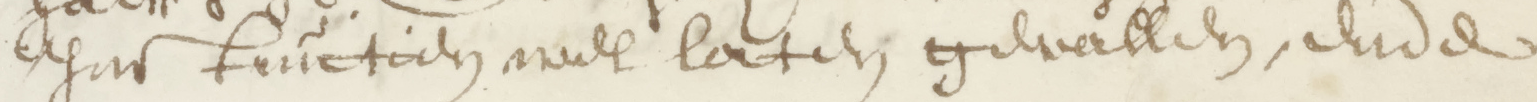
Instructien wel laten gevallen, ende
